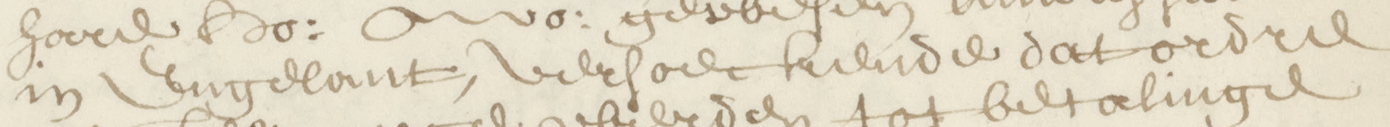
in Engelant, versoeckende dat ordre
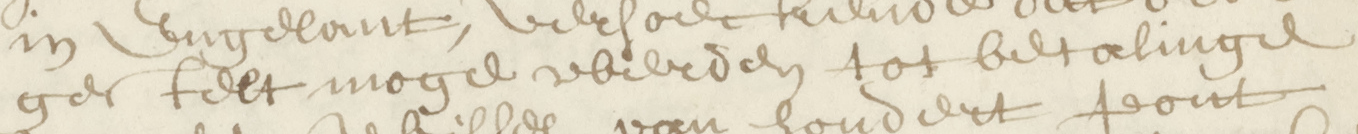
gestelt moge werden tot betalinge
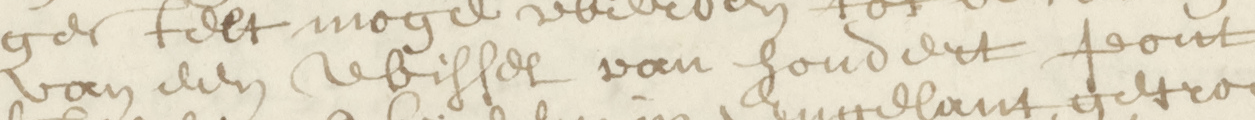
van een Wissel van hondert pont
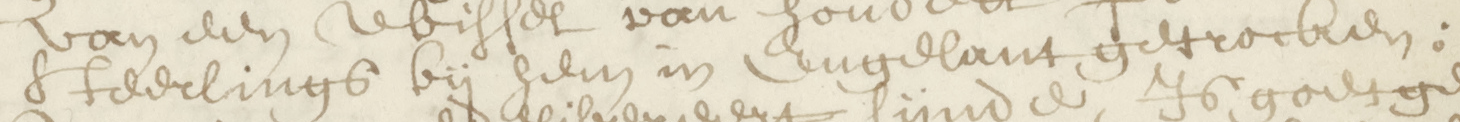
Steerlings bij hem in Engelant getrocken:
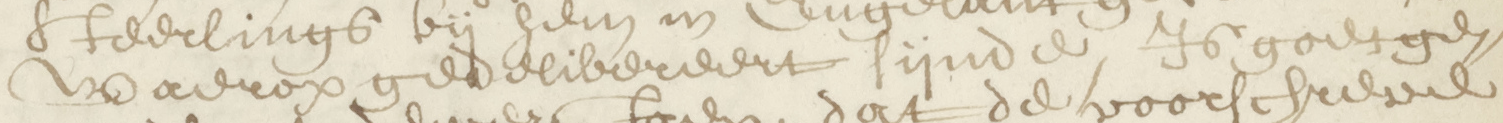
Waerop gedelibereert sijnde, Is goetge,,
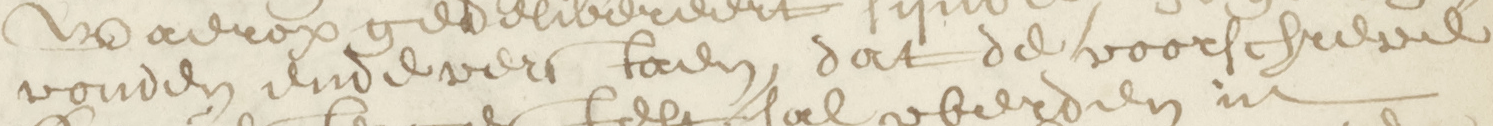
vonden ende verstaen, dat de voorschreve
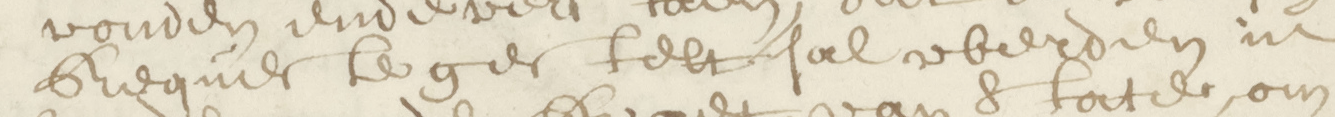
Requeste gestelt sal werden in
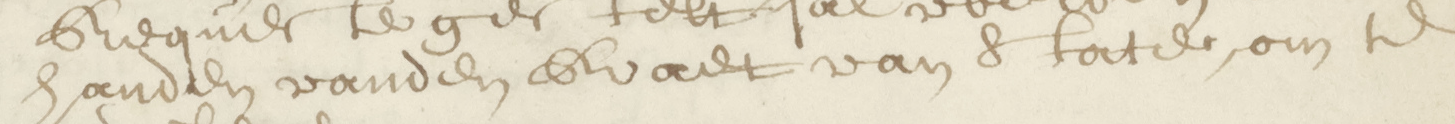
handen vanden Raet van State, om te
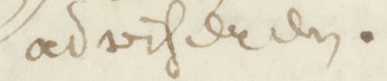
adviseren.
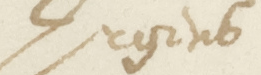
Degens
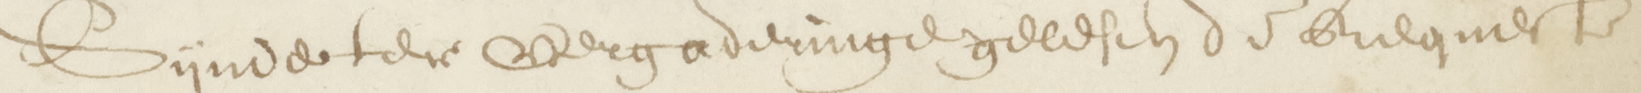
Sijnde ter Vergaderinge gelesen de Requeste
